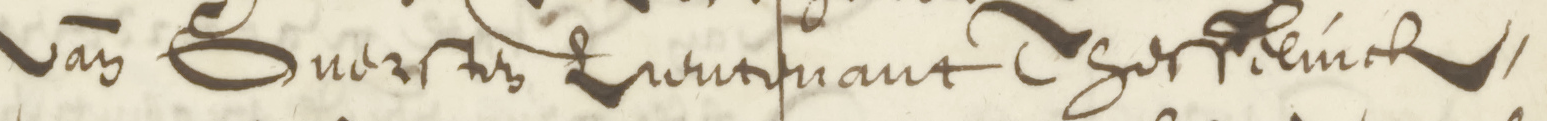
van Ouersten Lieutenant Thesselinck,
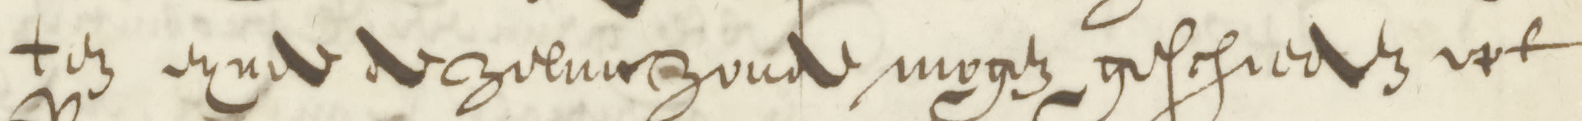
ten eynde de zelue zoude mogen geschieden opt
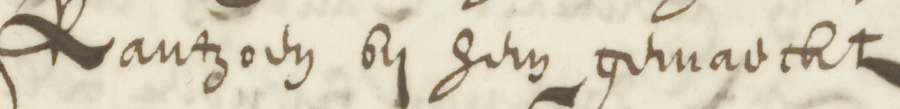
Rantzoen by hem gemaeckt
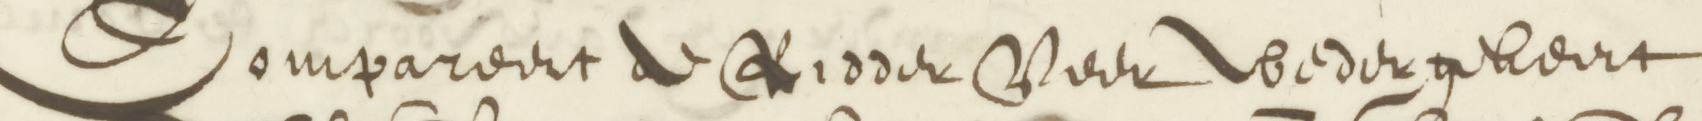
Compareert de Ridder Veer wedergekeert
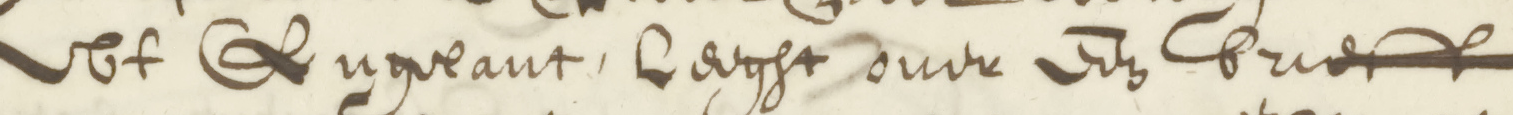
Wt Engelant, Leeght ouer een Brieff
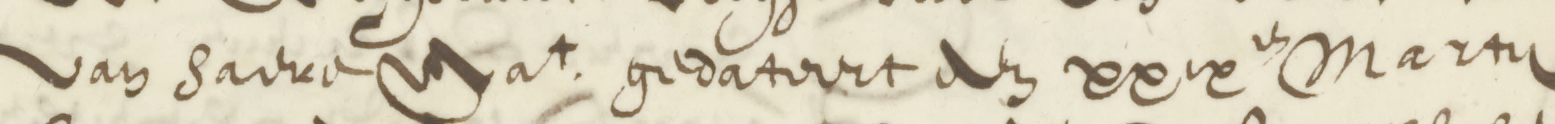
van haere Mat. gedateert den xxixen. Marty
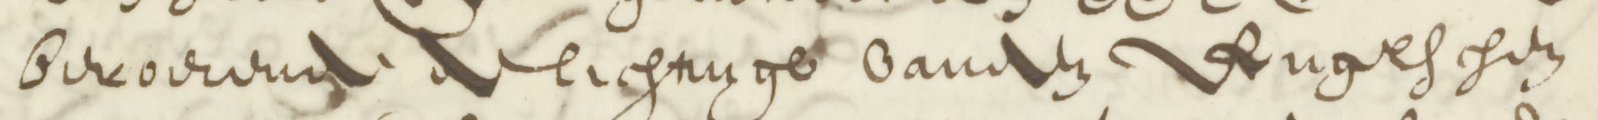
beroerende de lichtinge vanden Engelschen
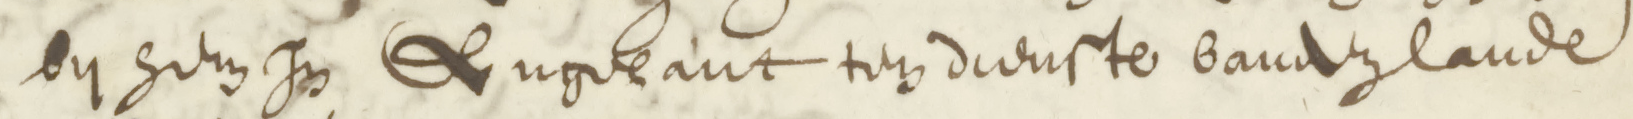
by hem In Engelant ten dienste vanden lande
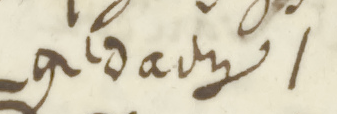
gedaen.
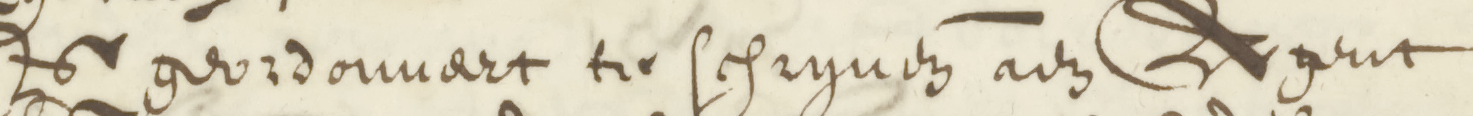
Is geordonneert te schryuen aen Agent
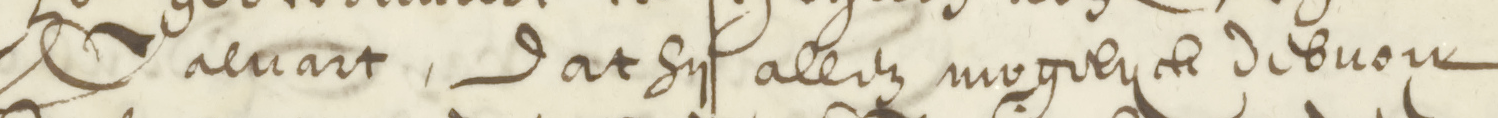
Caluart, dat hy allen mogelyck debuoir
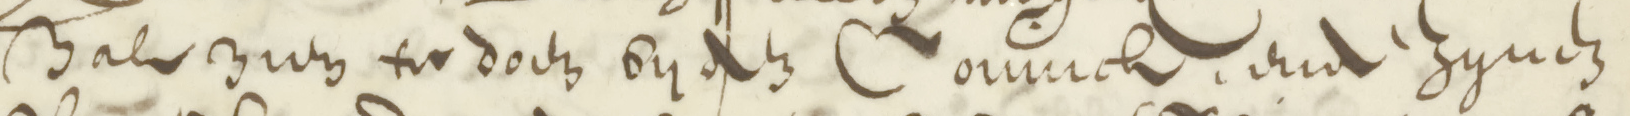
zal zien te doen byden Coninck, ende zynen
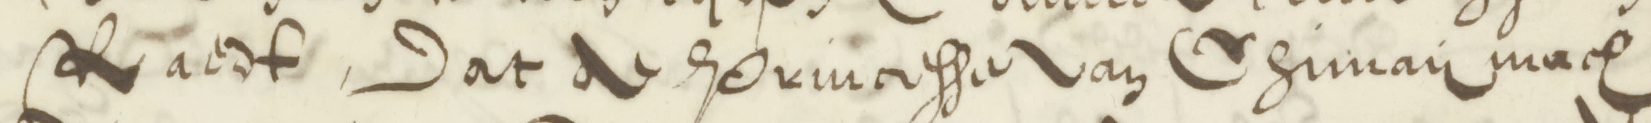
Raedt, Dat de Princesse van Chimay mach
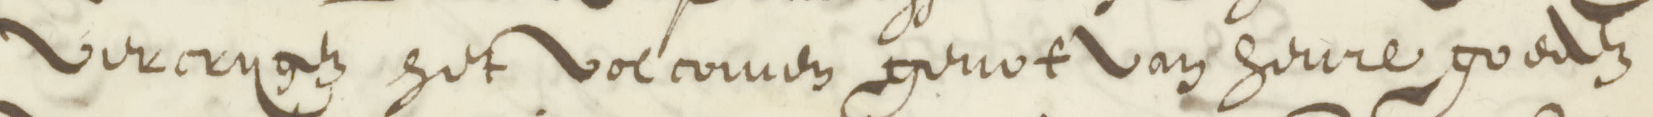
vercrygen het volcomen genot van heure goeden
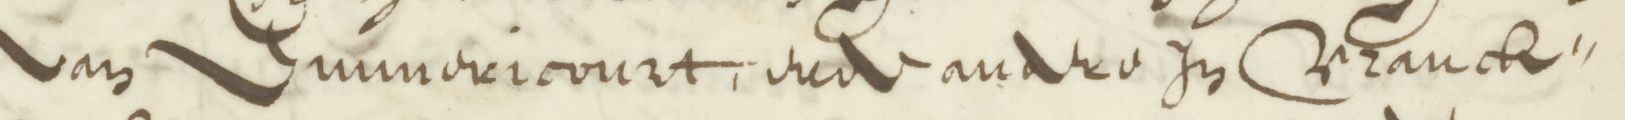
van Emmericourt, ende andere In Vranck„
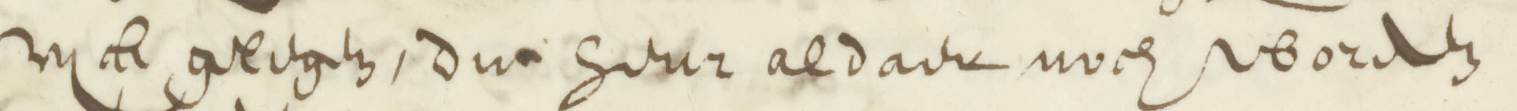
ryck gelegen, die heur aldaer noch worden
